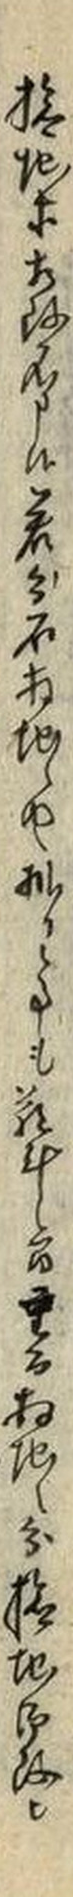検地等相改不申候若分石拝地之内へ掛り候事も難斗候間重て拝地之分検地御改被
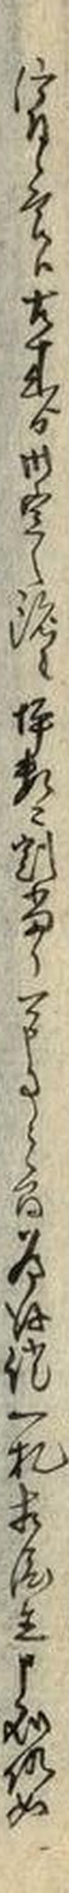仰付候節は古来ゟ御定之銘々坪数に割当り可申事に候間為後証一札相渡置申処仍如
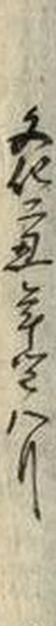文化二丑年閏八月
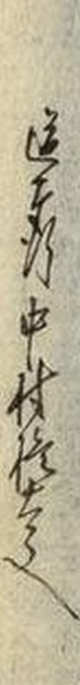件道奉行中村権大夫
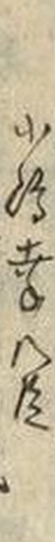小島幸八殿
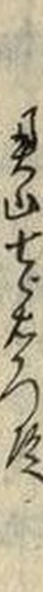奧山七郎右衛門殿
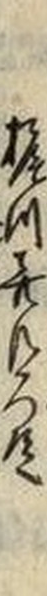梶川喜左衛門殿
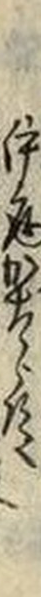伊庭加太郎殿
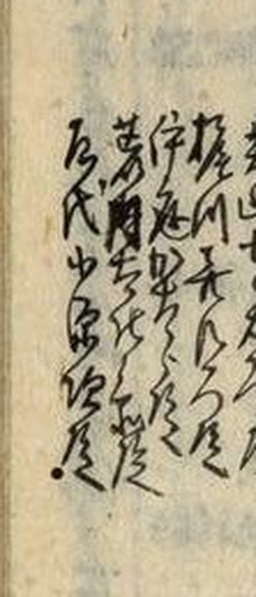荒川太次兵衛殿
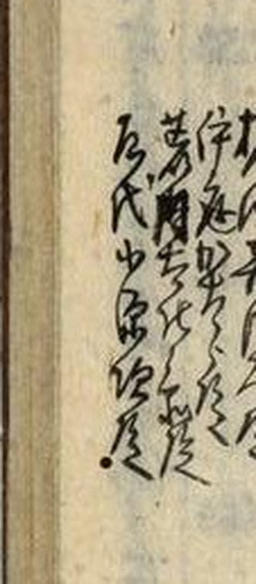屋代小源次殿

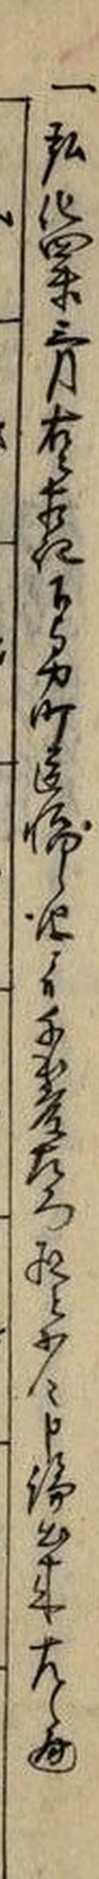一弘化四未三月右に相記下与力町道幅之儀に付千本藤左衛門組と少々申論出来左之通
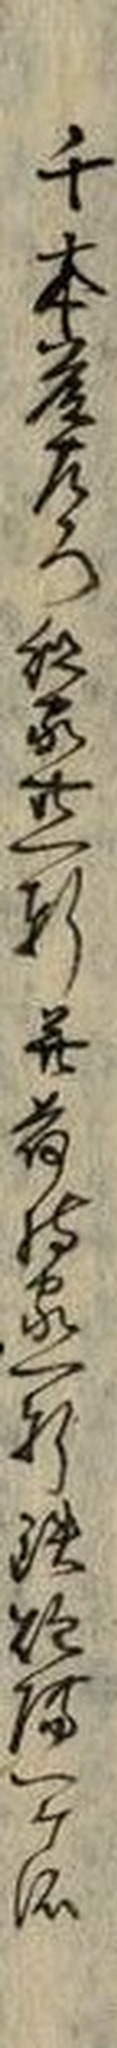千本藤左衛門組家廿一軒并荷持家一軒鉄炮場一ケ所
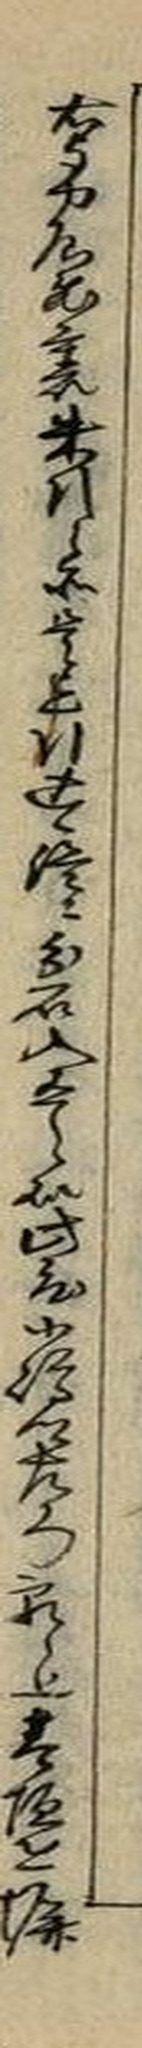右与力屋敷裏朱引之所是迄引込候侭に分石入有之候処此度小島郷左衛門願之上青垣を塀
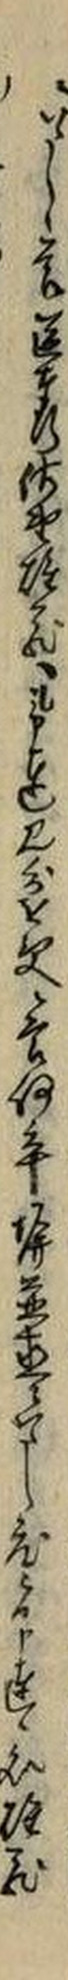にいたし候節道奉行佐野雄蔵へも申達見分を受候節何卒塀並直にいたし度旨申達候処雄蔵
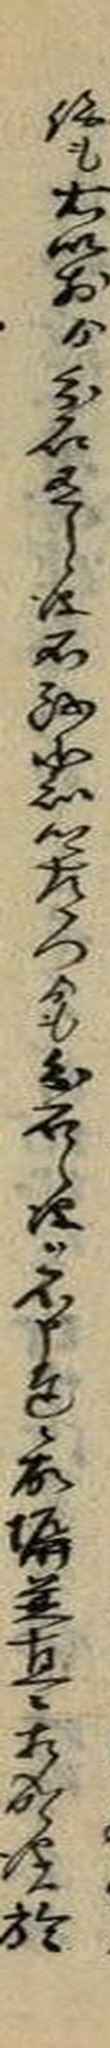儀も右以前ゟ分石有之候儀不致承知郷左衛門ゟも分石之儀は不申達候故塀並直に相成候儀は於
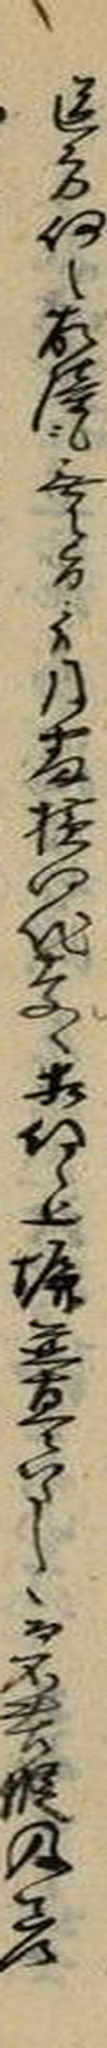道方何の故障も無之旨に付月番横田作大夫へ相伺候上塀並直にいたし候て不苦段及差
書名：御城下諸事之部
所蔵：福井県文書館 Fukui Prefectural Archives
